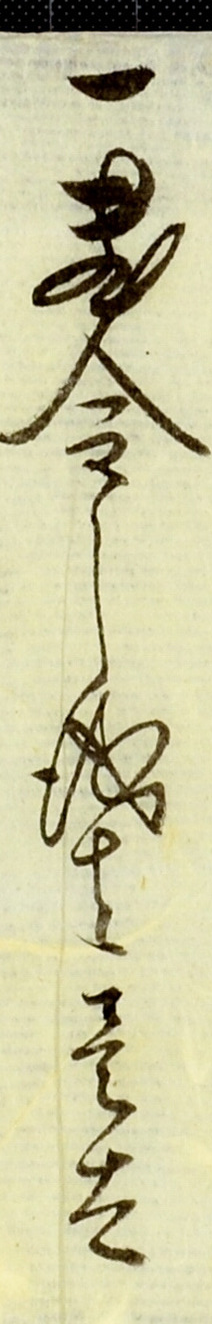一敷金之儀は壱太
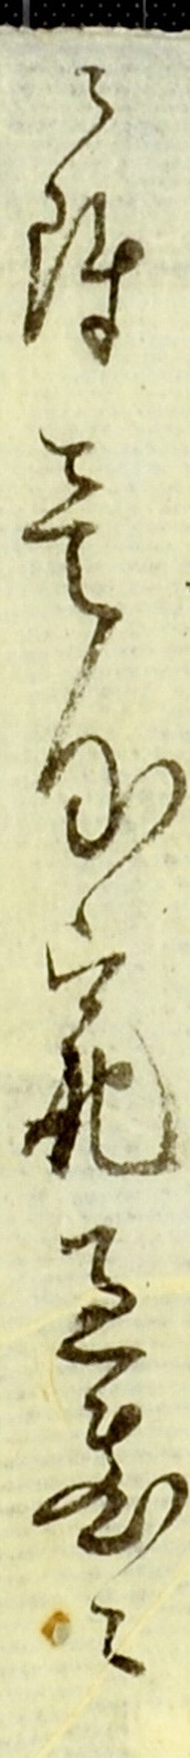に附壱匁宛過敷に
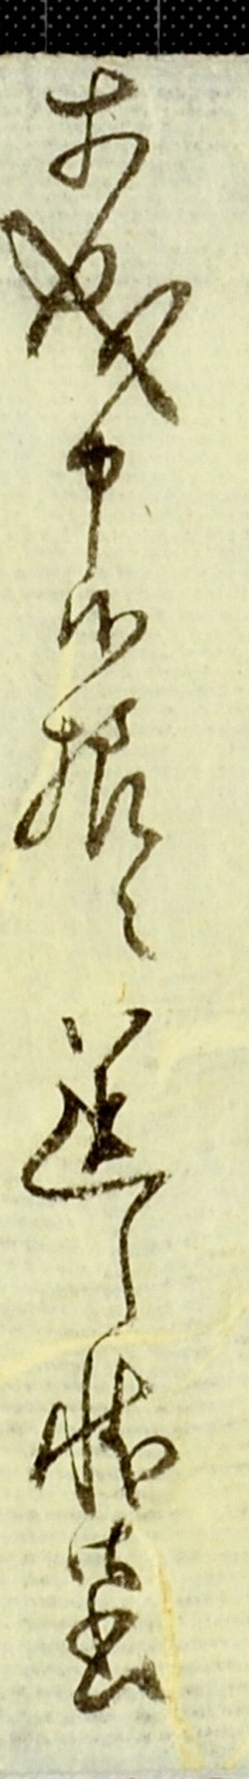相成申候様に送り状御書
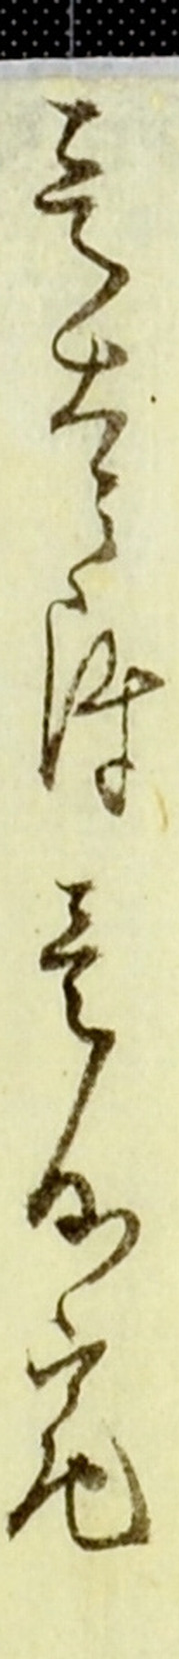壱太に附壱匁宛
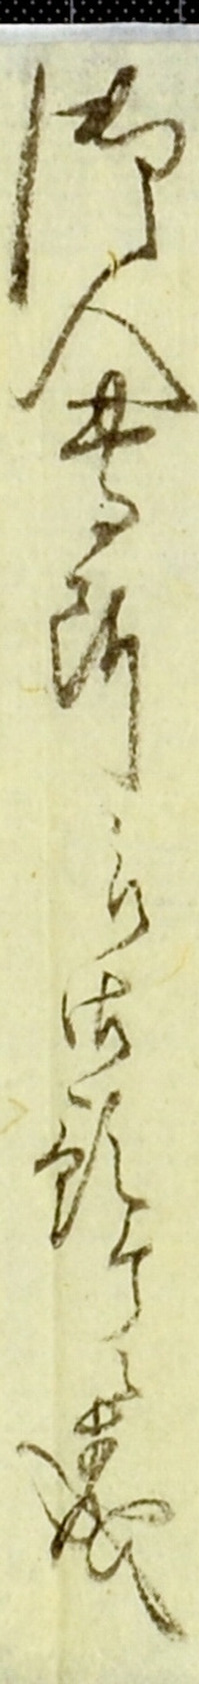御会所え御預ヶに相成
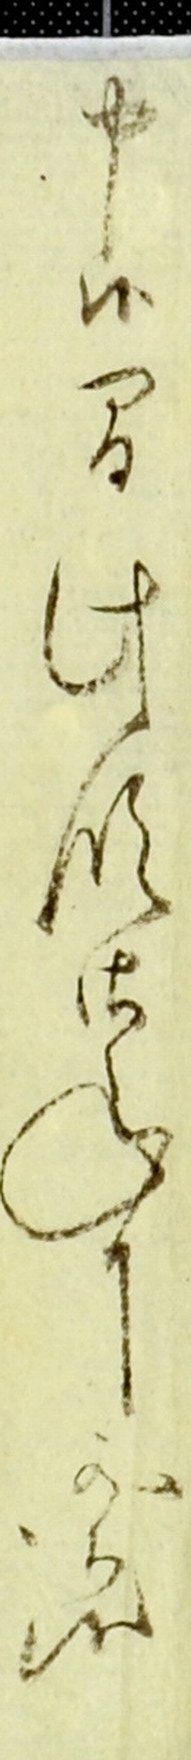申候間此段御承引可被下候
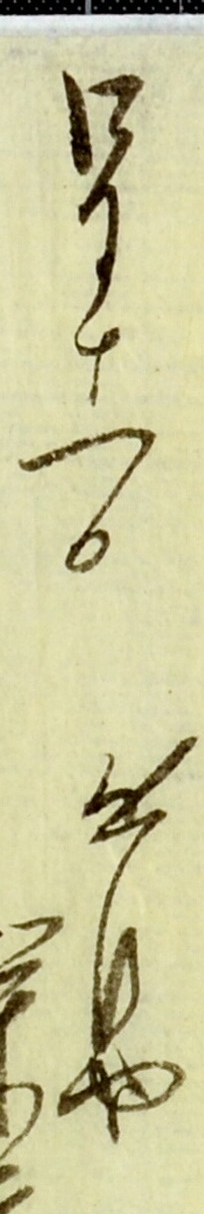四月十一日近江や
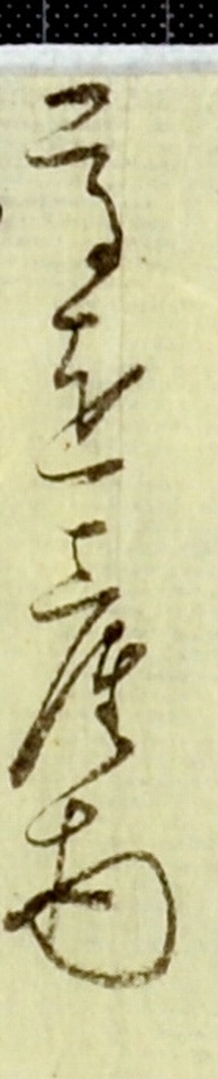高遠産物
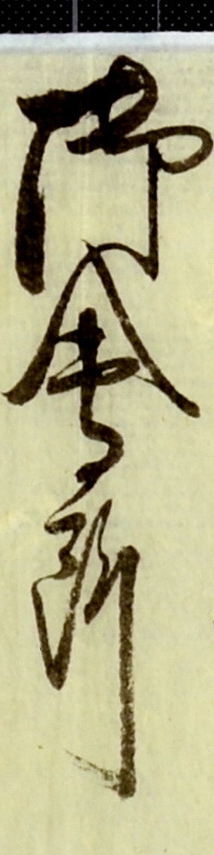御会所
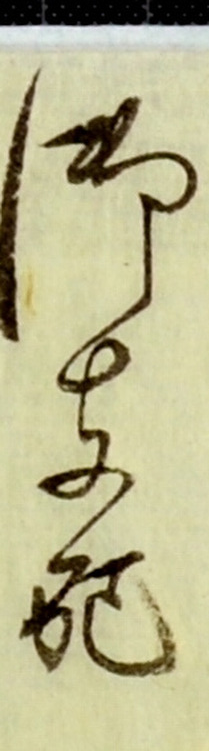御支配

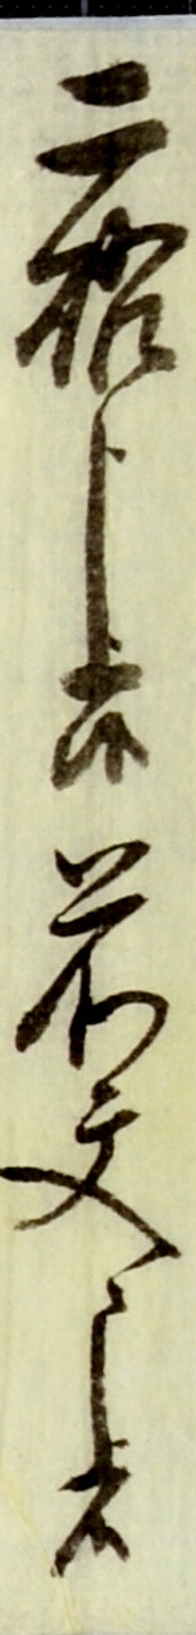二啓申上候前文申上候
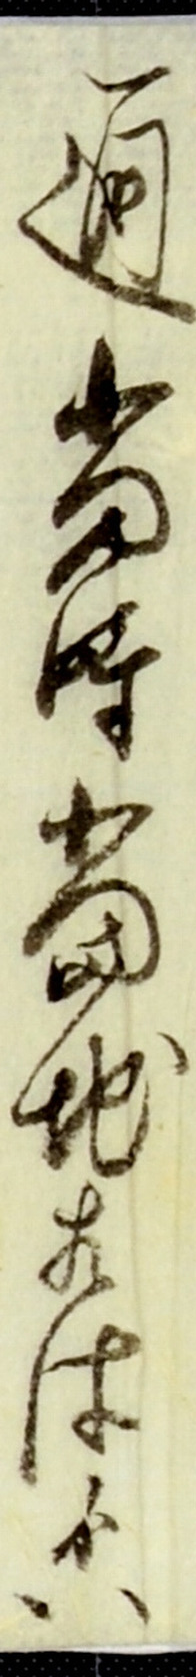通当時当地相はゟは
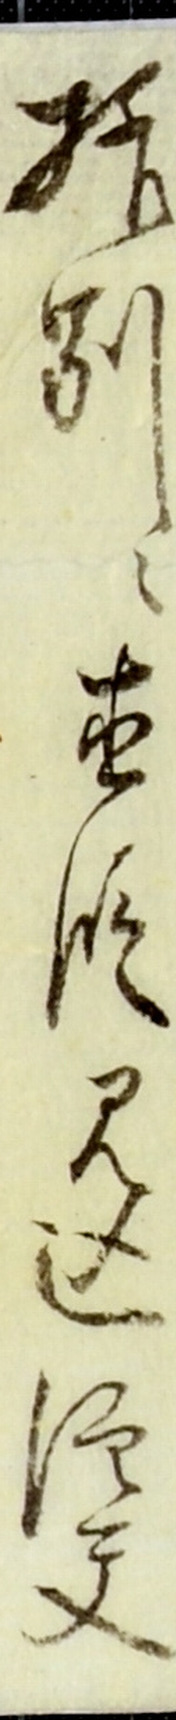格別に直段見込注文
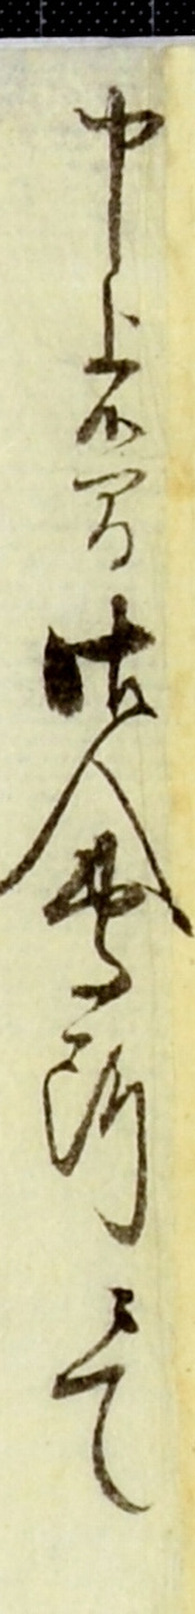申上候間御会所にて
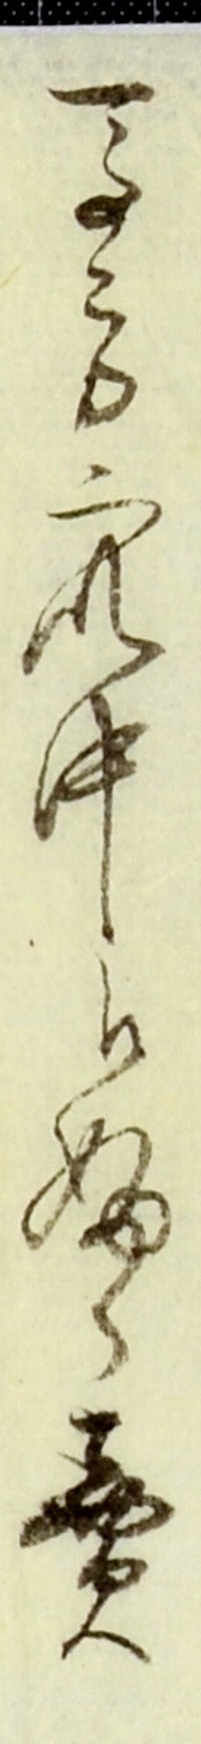馬方衆中えふり売
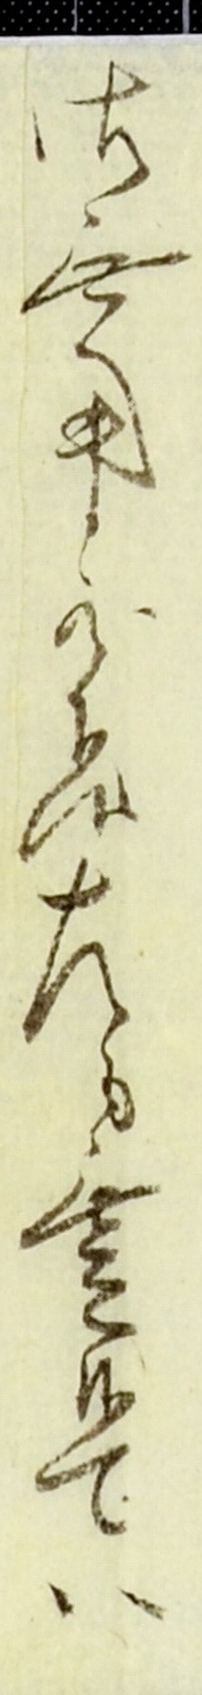御無用可被下候左も無之候ては
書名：書状
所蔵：伊那市立高遠町図書館・合同会社AMANE
